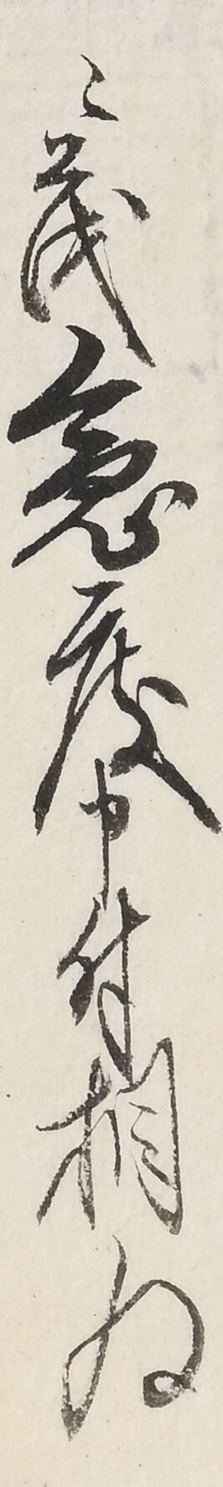ニも急度申付相為
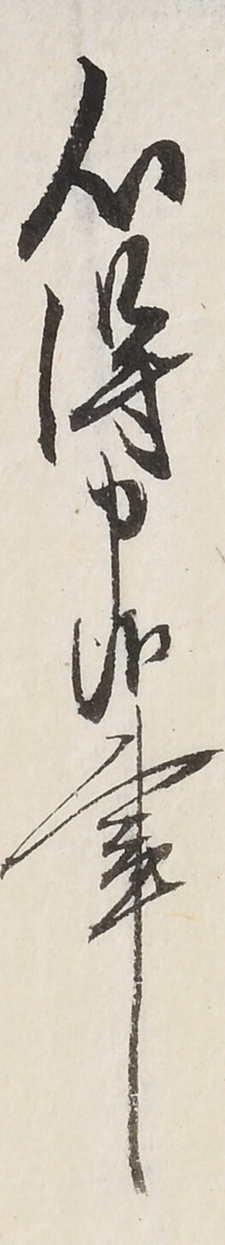心得申候事
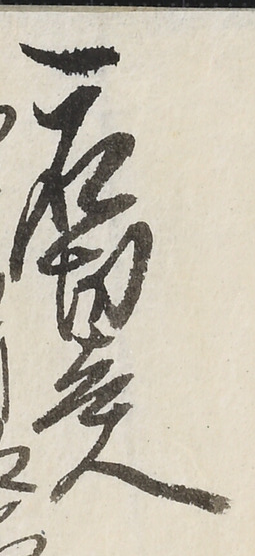一石切壱人
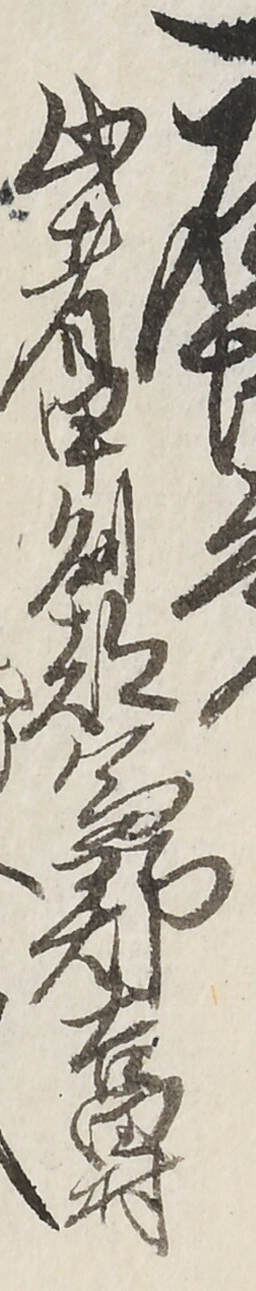此者甲州都留郡吉田村
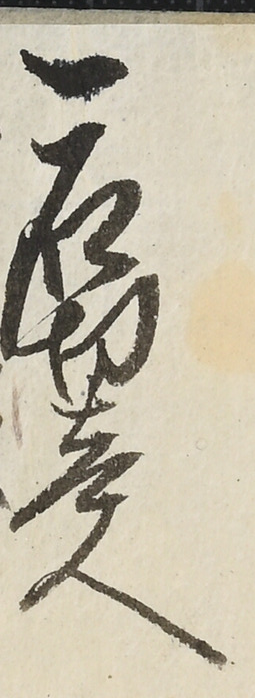一石切壱人
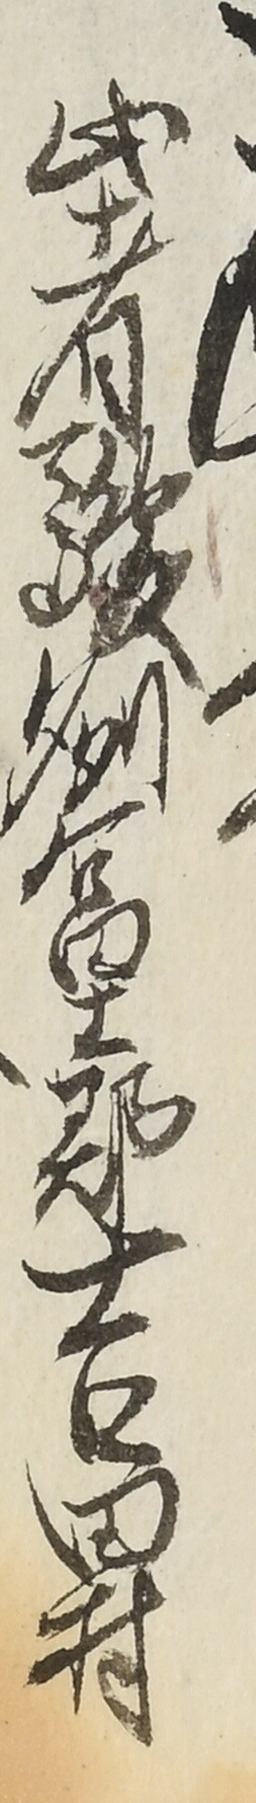此者駿州富士郡吉田村
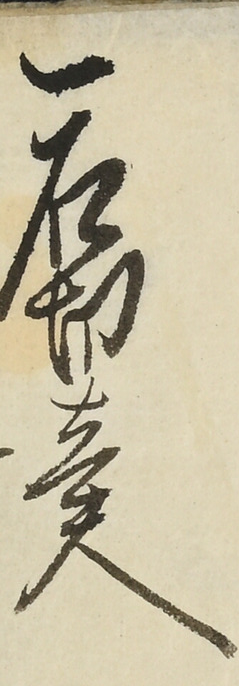一石切壱人
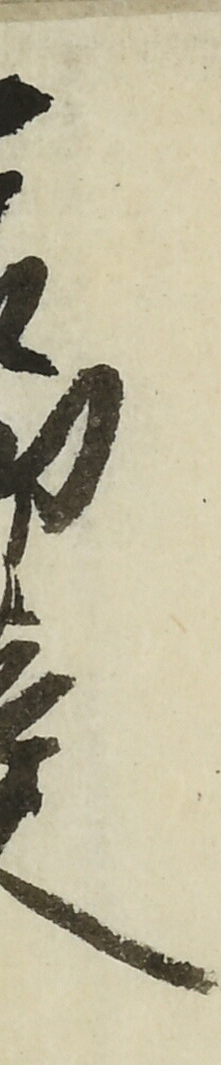一石切壱人

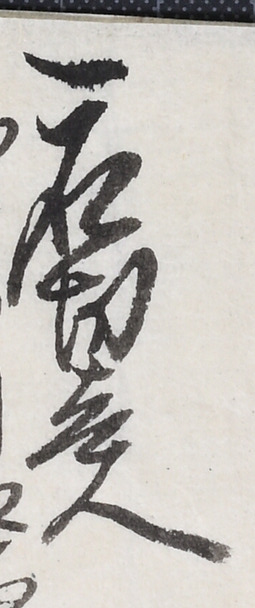一石切壱人
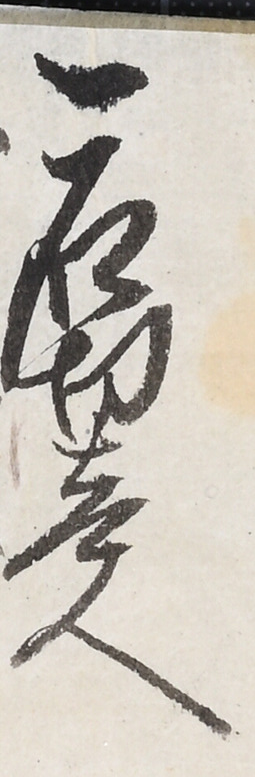一石切壱人
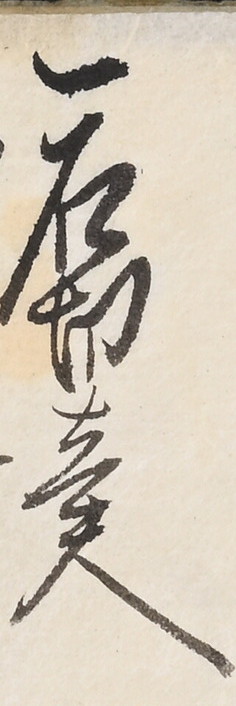一石切壱人
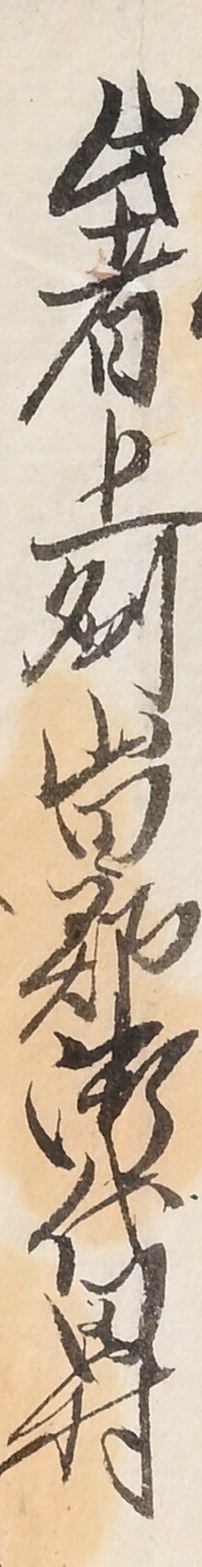此者上州山田郡御代田村
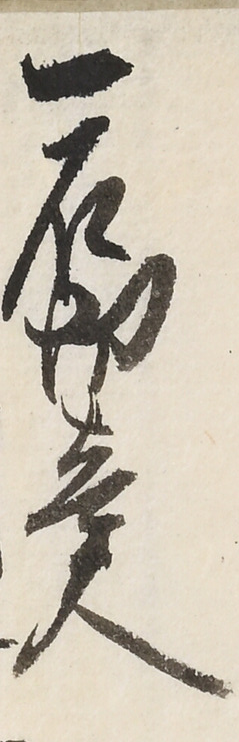一石切壱人
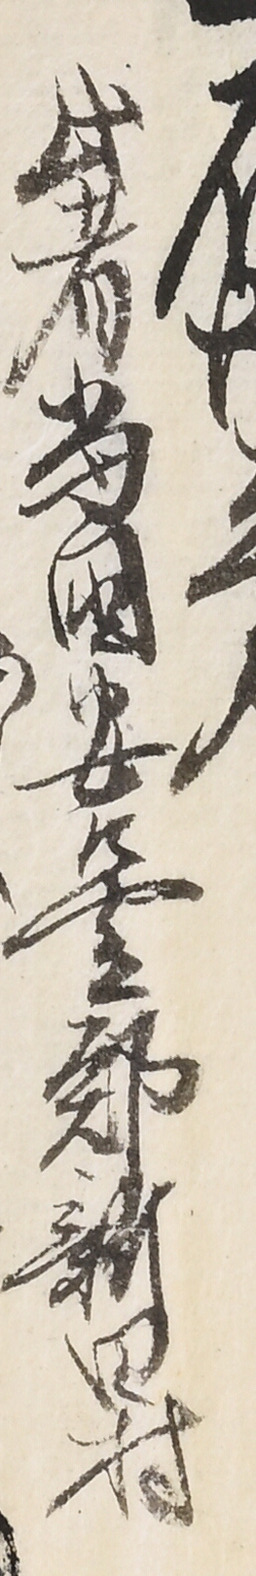此者当国安曇郡新田村
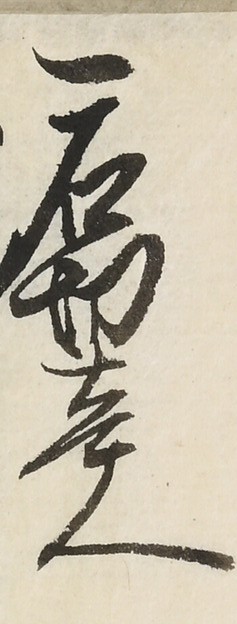一石切壱人
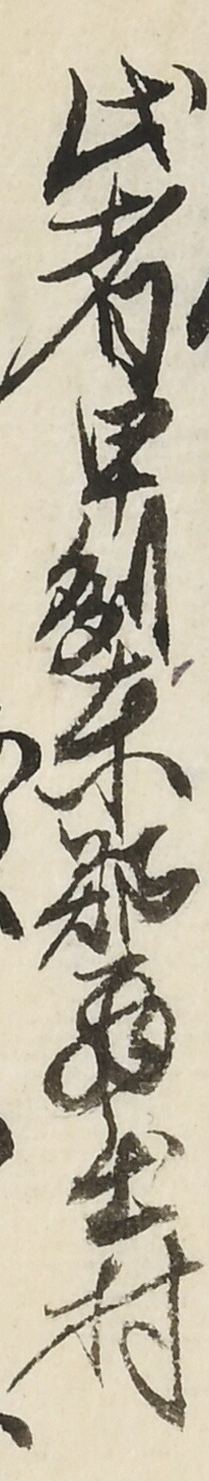此者甲州東郡西出村
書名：文久四甲子年二月石切名前書上帳
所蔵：伊那市立高遠町図書館・合同会社AMANE
